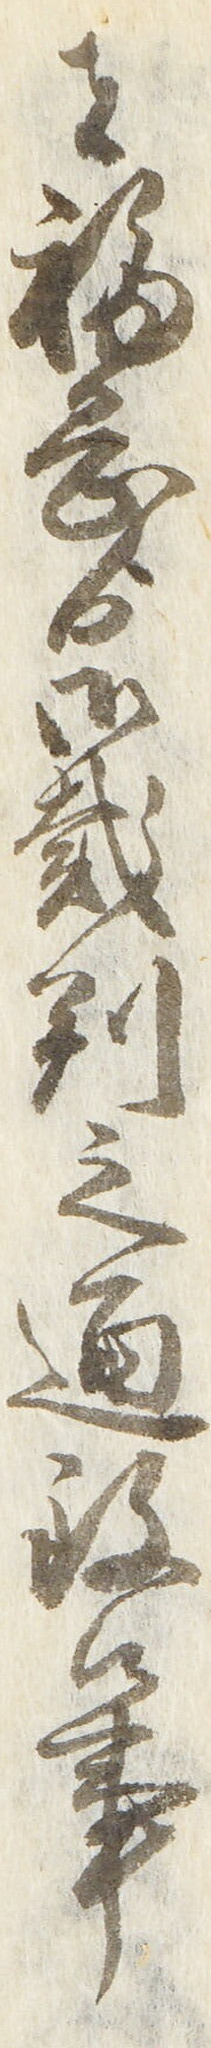者福岡ゟ御裁判之通致候事
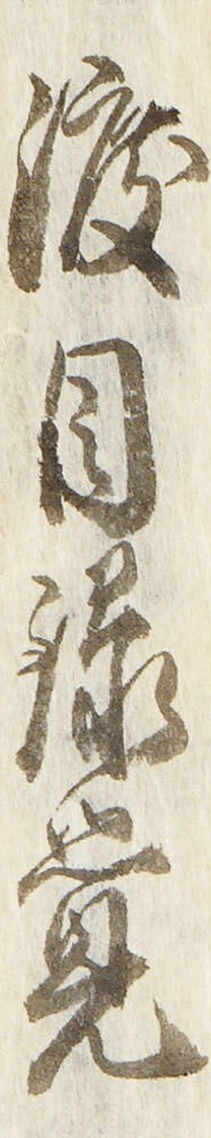渡目録覚
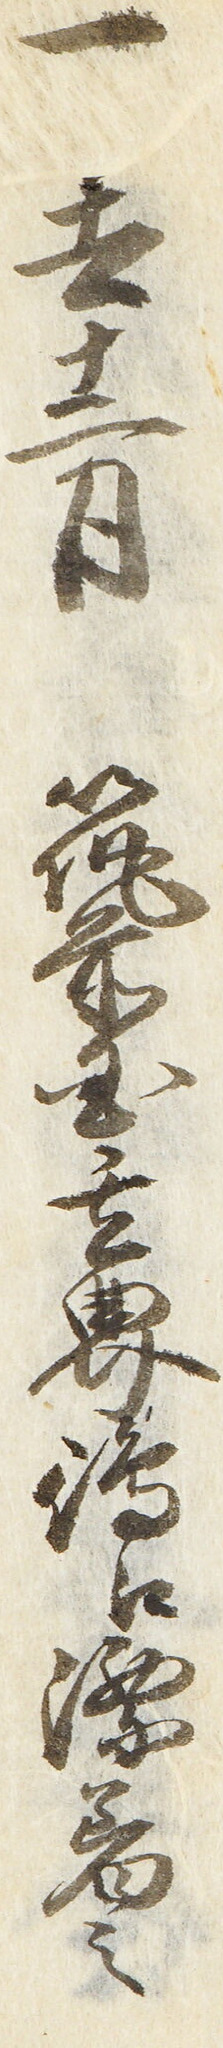一去十二月筑前国玄界嶋江漂着之
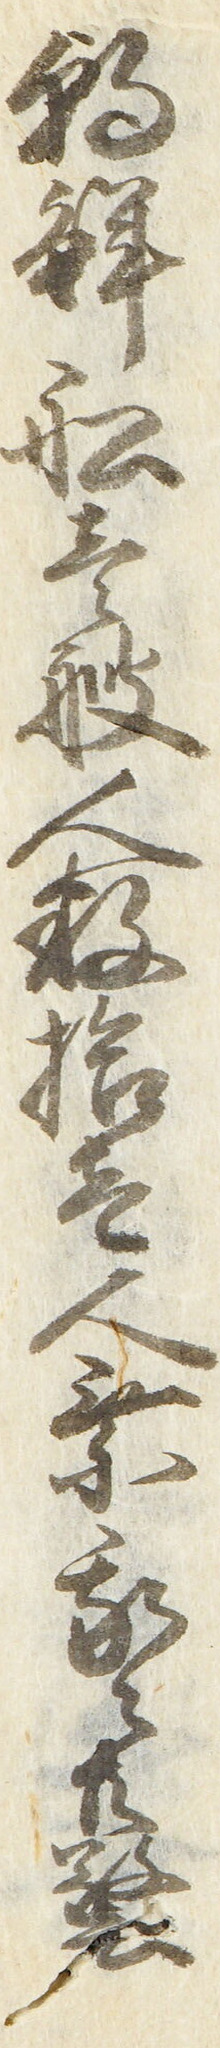朝鮮船壱艘人数拾壱人乗我々共警

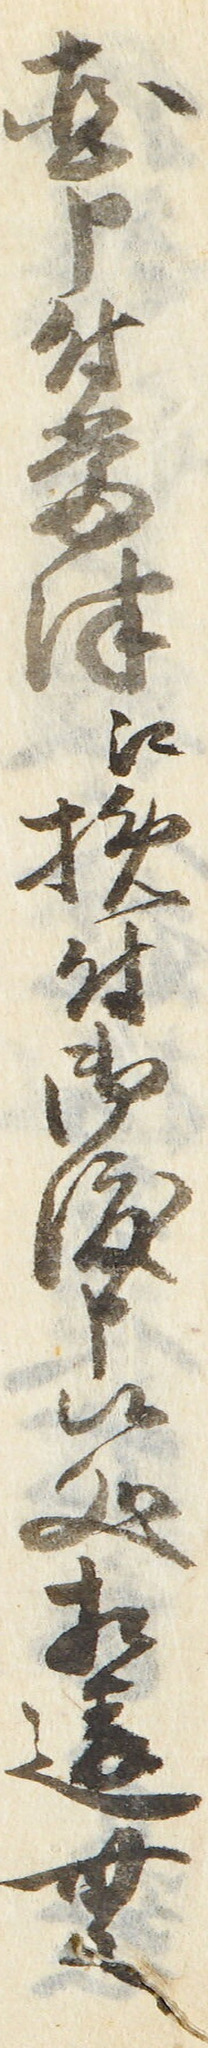固申付当津江挽付御渡申候処相違無之
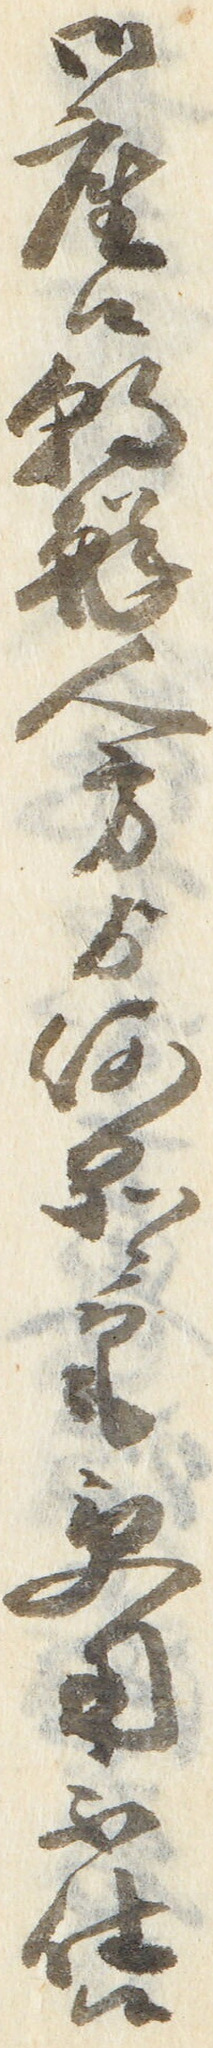御座候朝鮮人方ゟ何品ニ而も受用不仕候
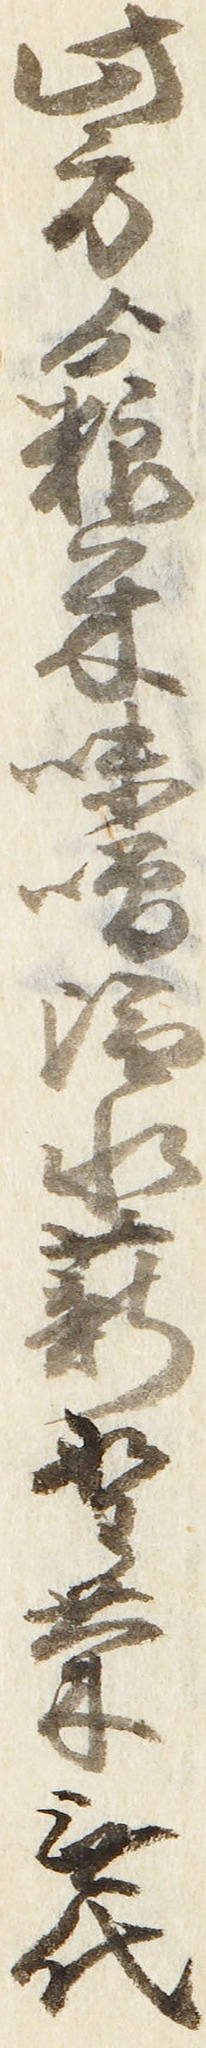此方ゟ粮米味噌塩水薪野菜無代
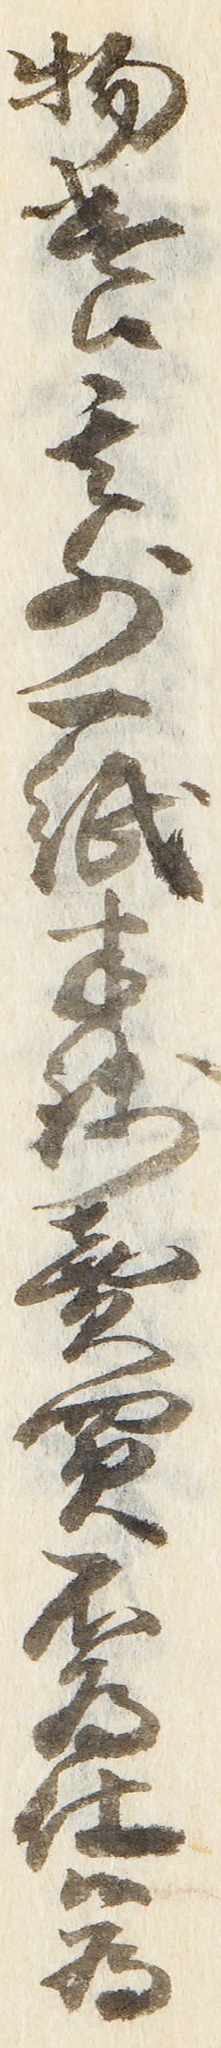物遣候其外一紙半銭売買不為仕候為
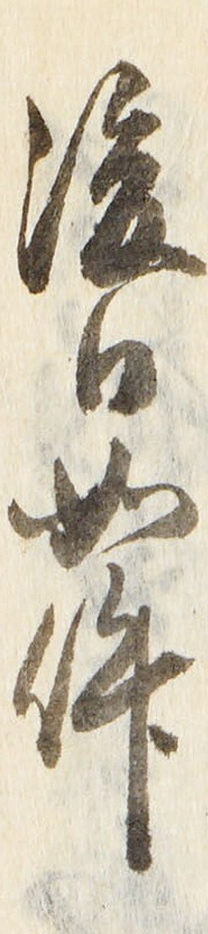後日如件
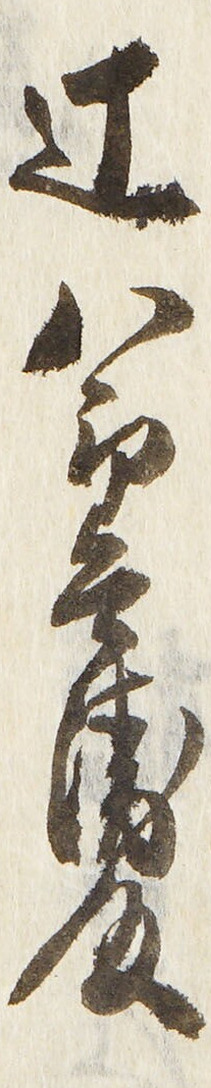辻八郎兵衛殿
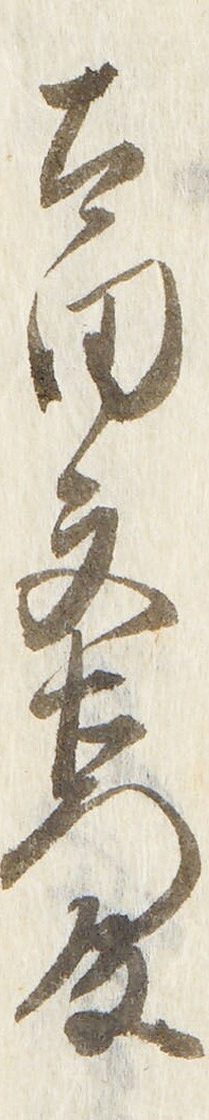太田文右衛門殿
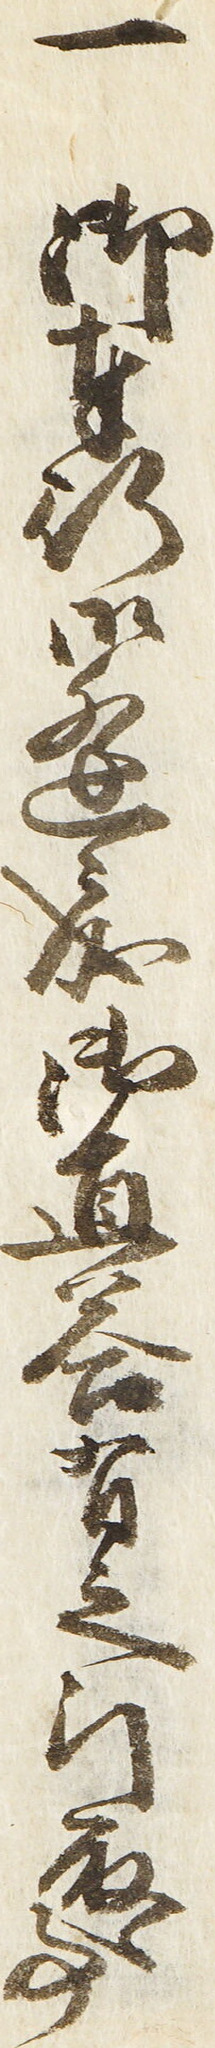一御奉行御逢ニ成御直答有之引取候事
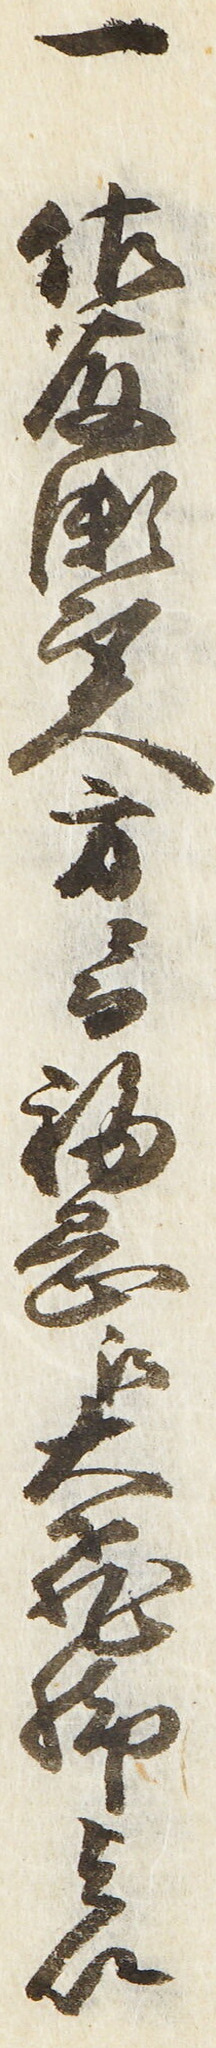一佐藤瀬大夫方ニ而福岡江大飛脚を以
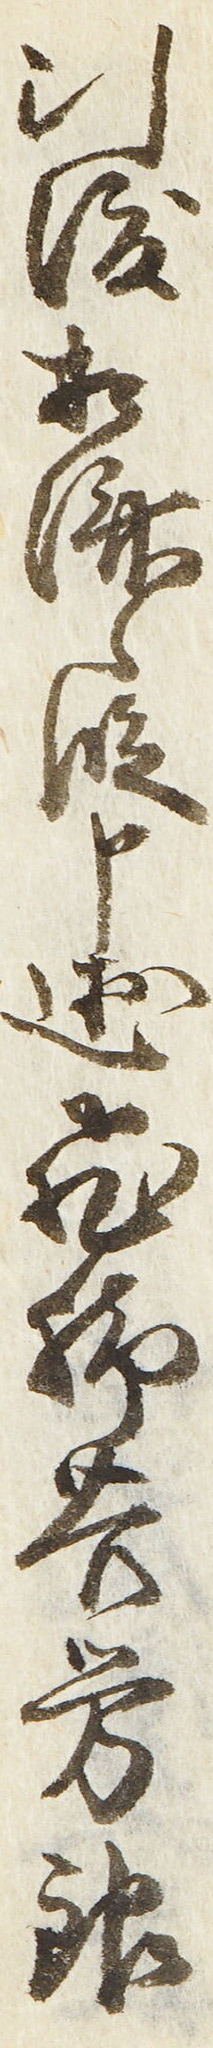引渡相済候段申述飛脚苦労銀
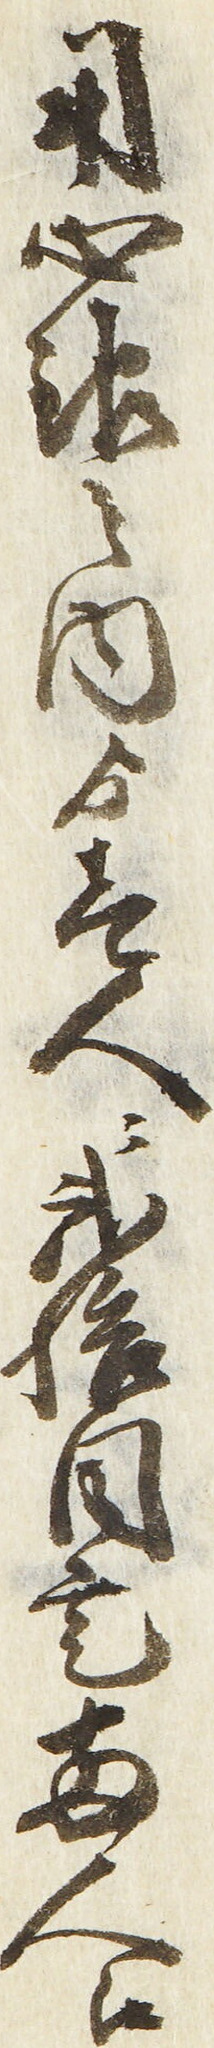用心銀之内ゟ壱人ニ弐拾目充両人江
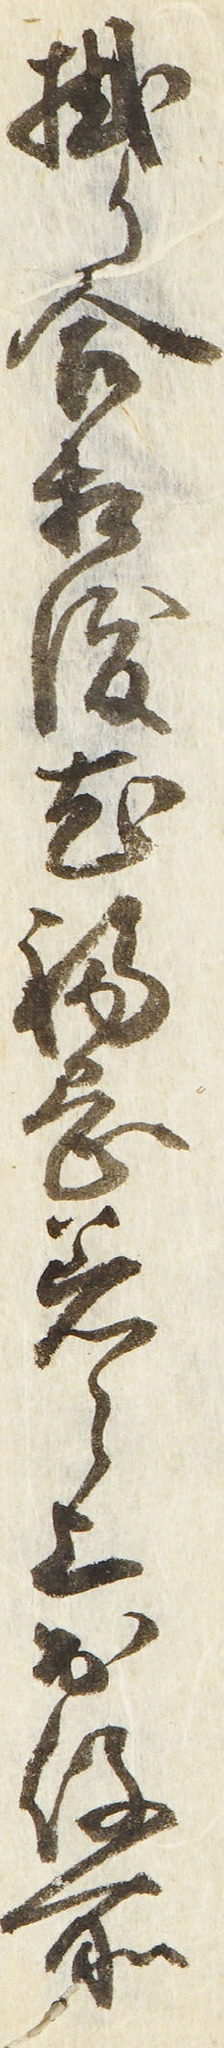掛り合相渡尤福岡着之上於役所
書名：玄海嶋江漂着船為警固長崎江被越候覚
